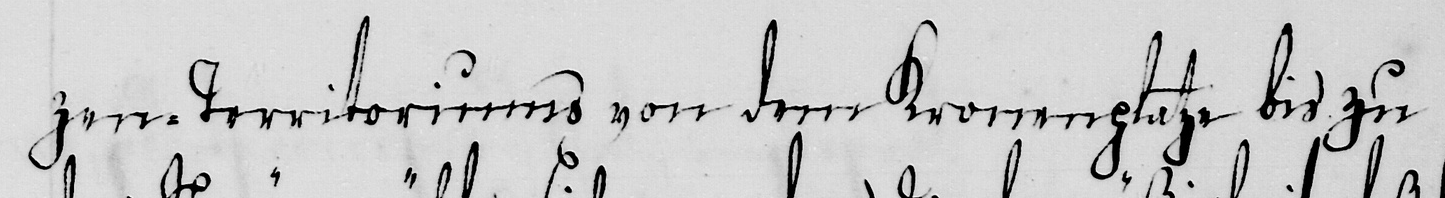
zen-Territoriums von dem Kronenplatze bis zu
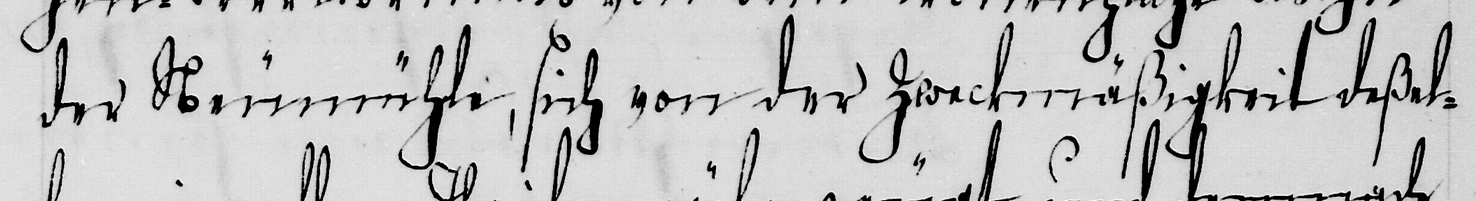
der Neumühle, sich von der Zweckmäßigkeit deßel¬
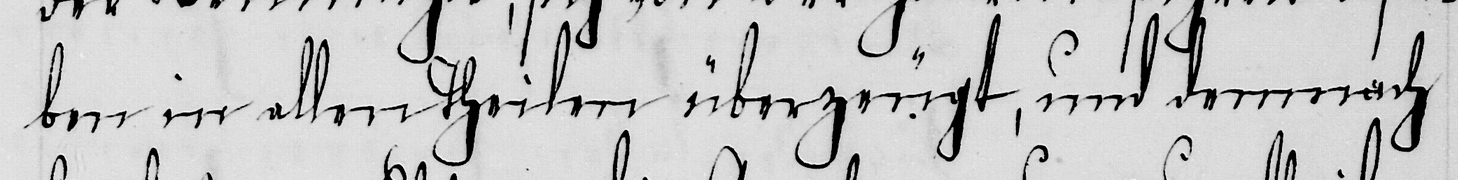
ben in allen Theilen überzeugt, und demnach
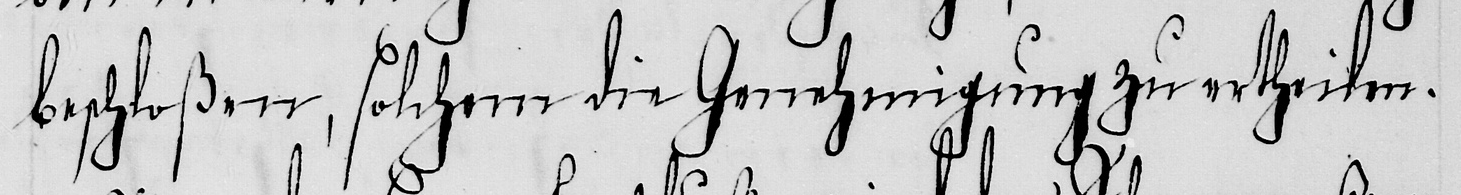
beschloßen, solchen die Genehmigung zu ertheilen.
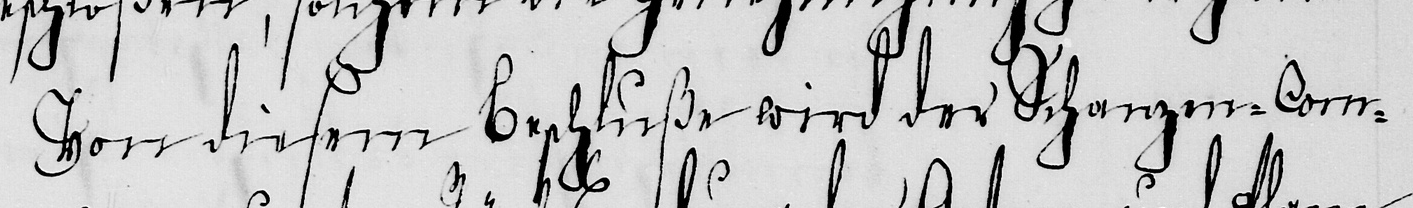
Von diesem Beschluße wird der Schanzen-Com¬
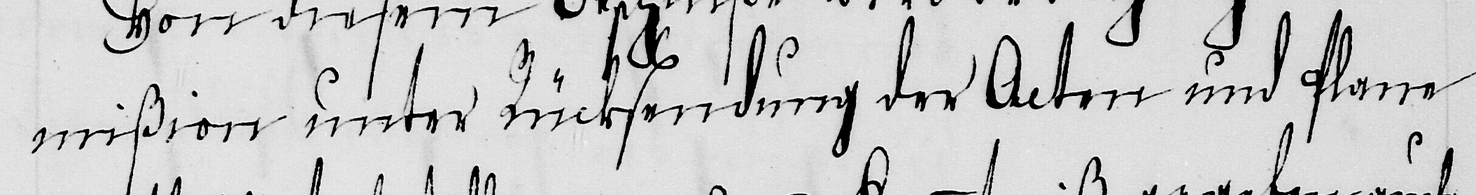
mißion unter Rücksendung der Acten und Plane
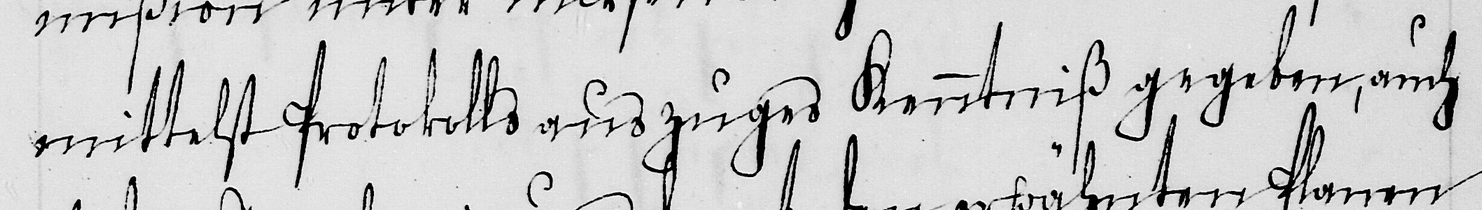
mittelst Protokollsauszuges Kenntniß gegeben, auch
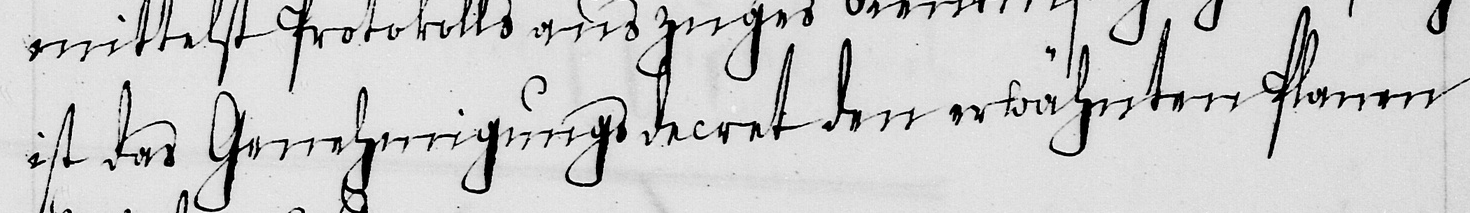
ist das Genehmigungsdecret den erwähnten Planen
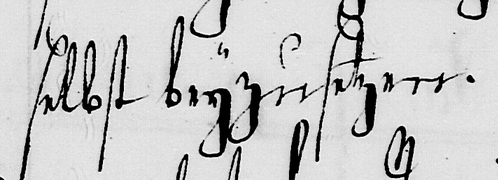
selbst beyzusetzen.
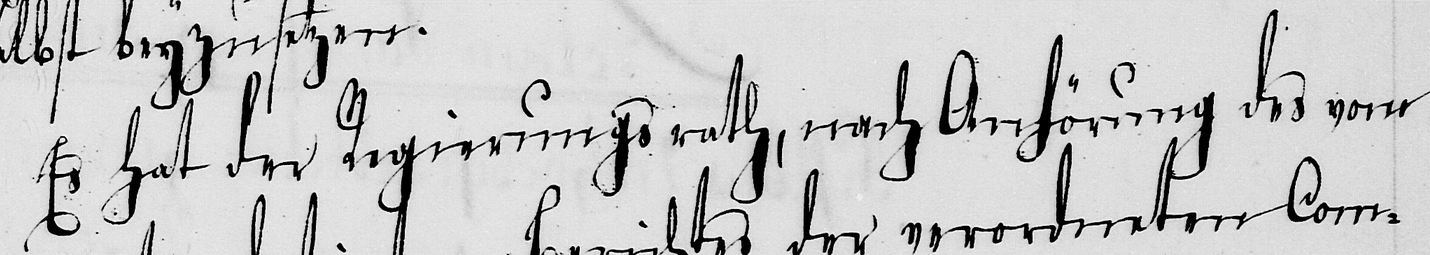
Es hat der Regierungsrath, nach Anhörung des vom
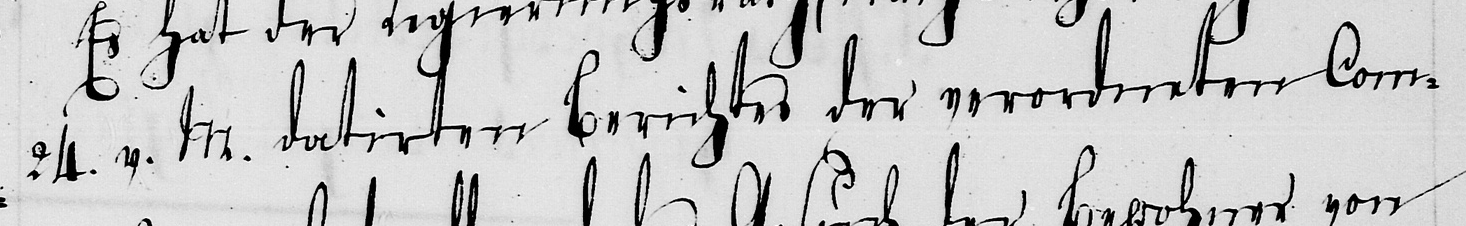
24. v. M. datirten Berichtes der verordneten Com¬
